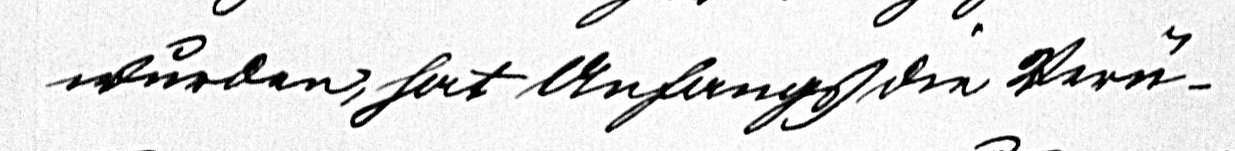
wurden, hat Anfangs die Verü¬
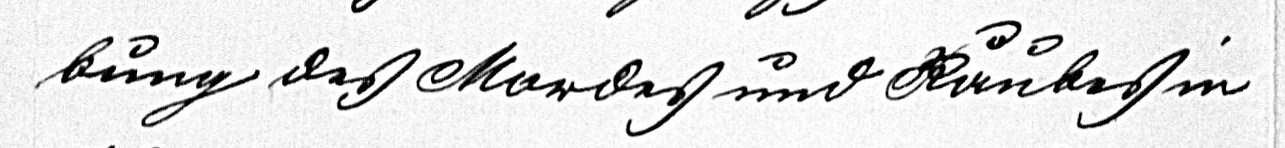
bung des Mordes und Raubes in
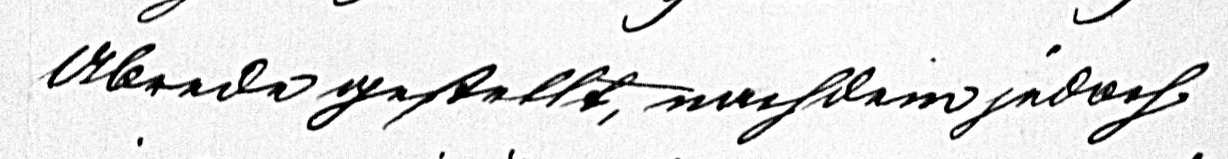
Abrede gestellt, nach dem jedoch
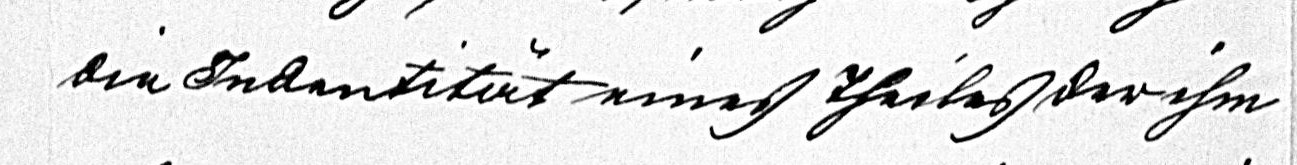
die Indentität eines Theiles der ihm
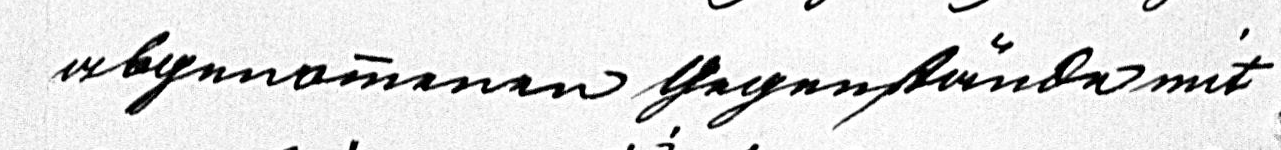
abgenommenen Gegenstände mit
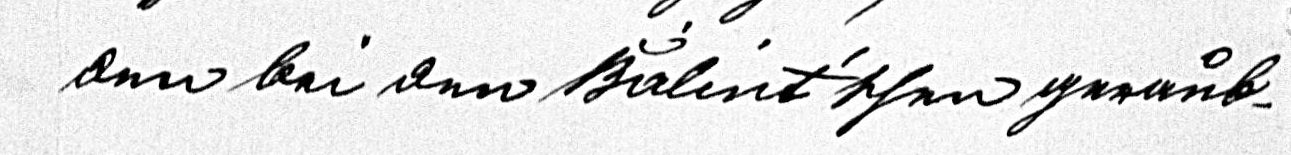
den bei den Balint'schen geraub¬
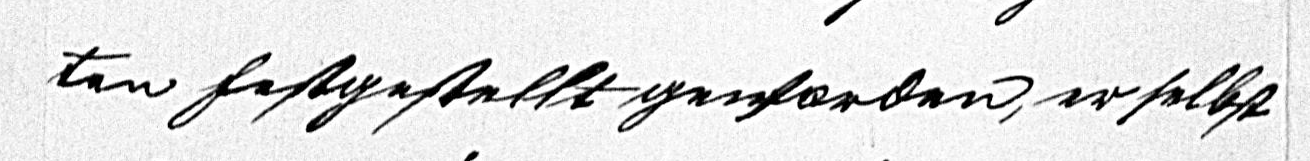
ten festgestellt geworden, er selbst
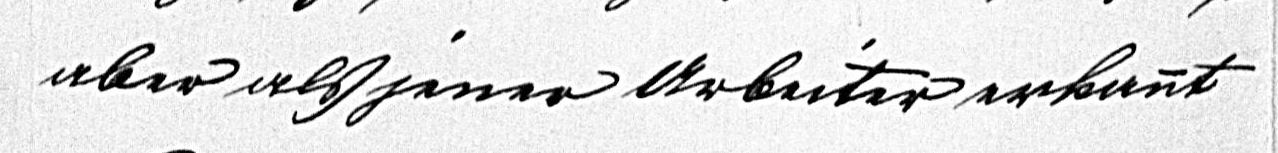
aber als jener Arbeiter erkannt
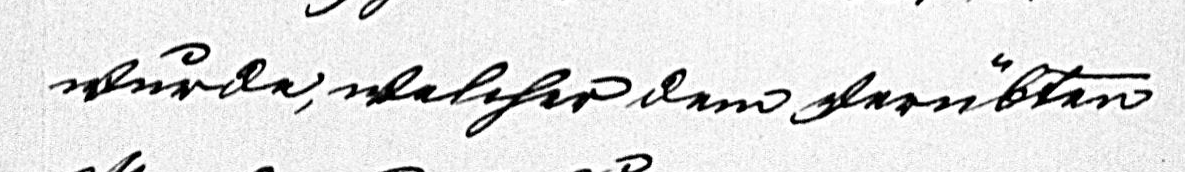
wurde, welcher dem verübten
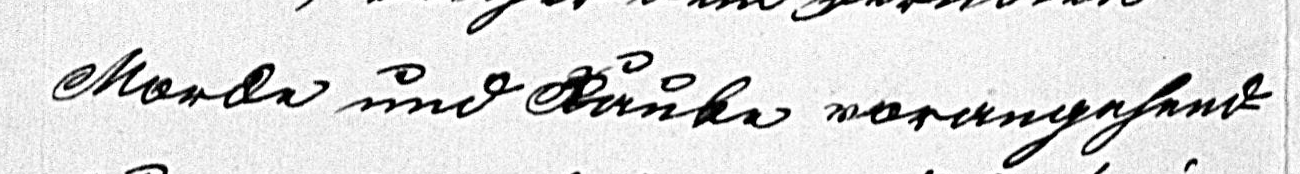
Morde und Raube vorangehend
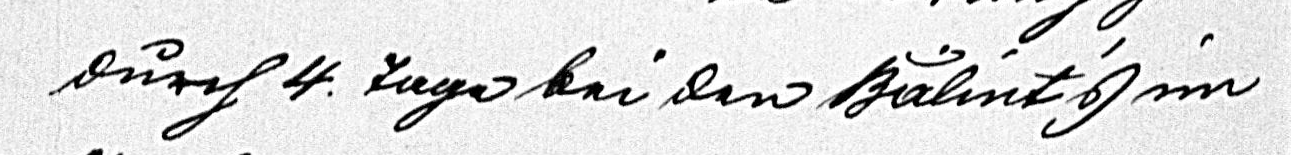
durch 4. Tage bei den Balint's im
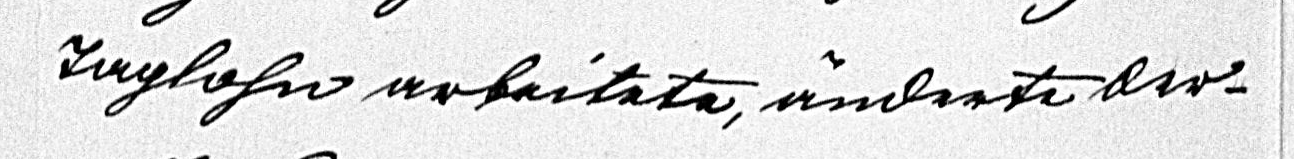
Taglohn arbeitete, änderte der¬
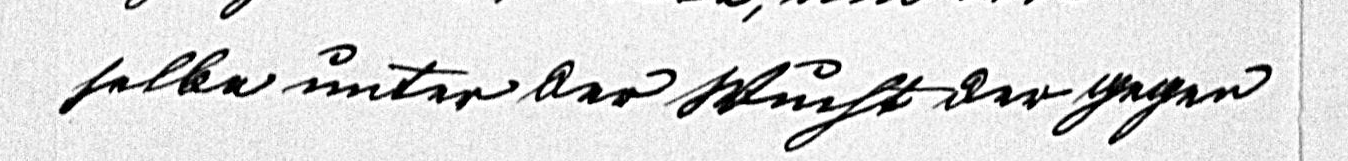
selbe unter der Wucht der gegen
